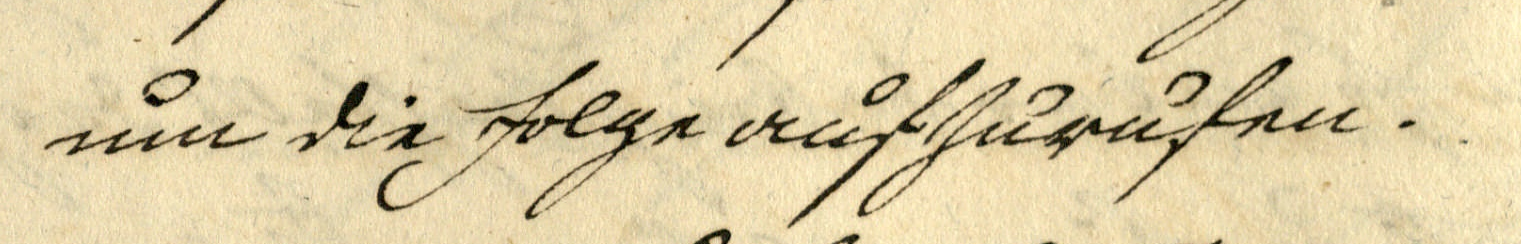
um die Folge aufzurufen.
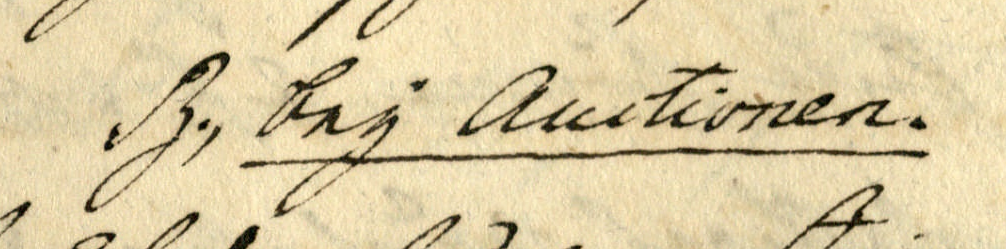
B., bey Auctionen.
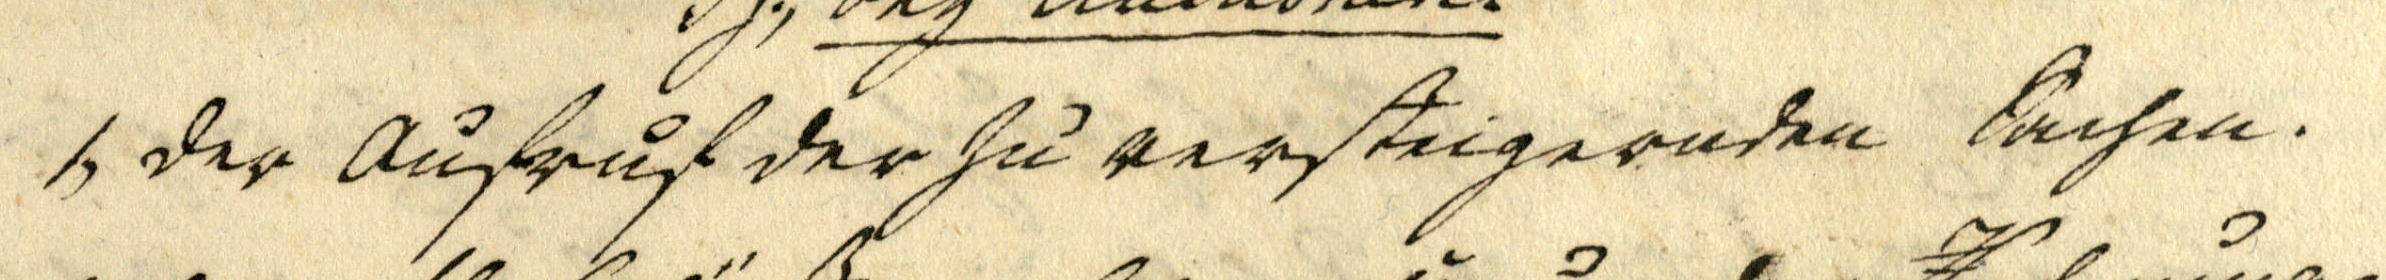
1, der Aufruf der zu versteigernden Sachen.
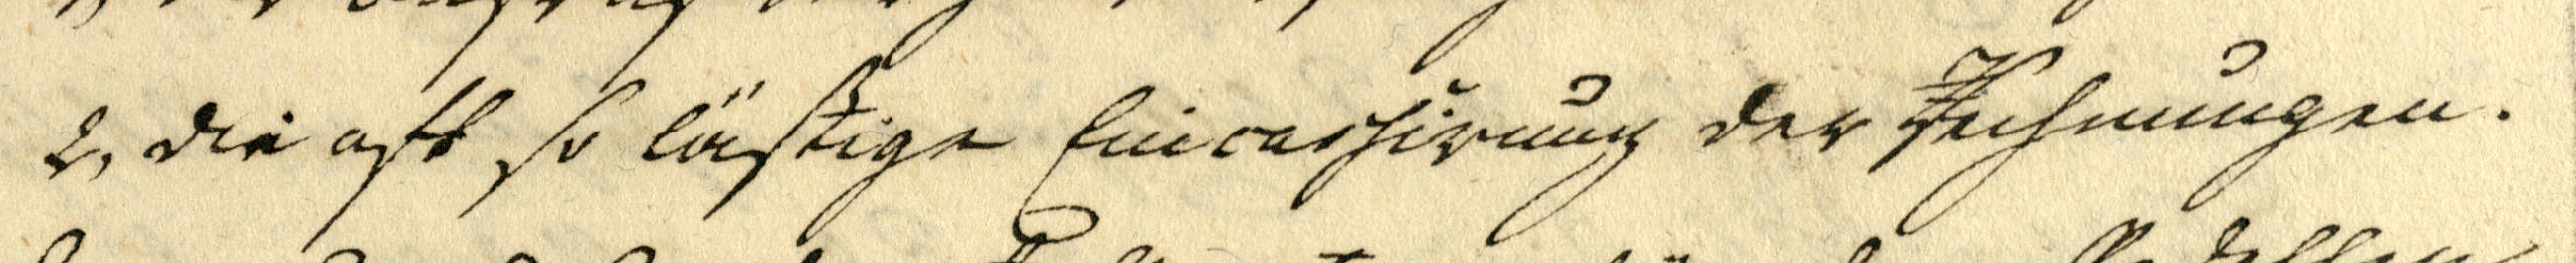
2., die oft so lästige Eincassirung der Rechnungen.
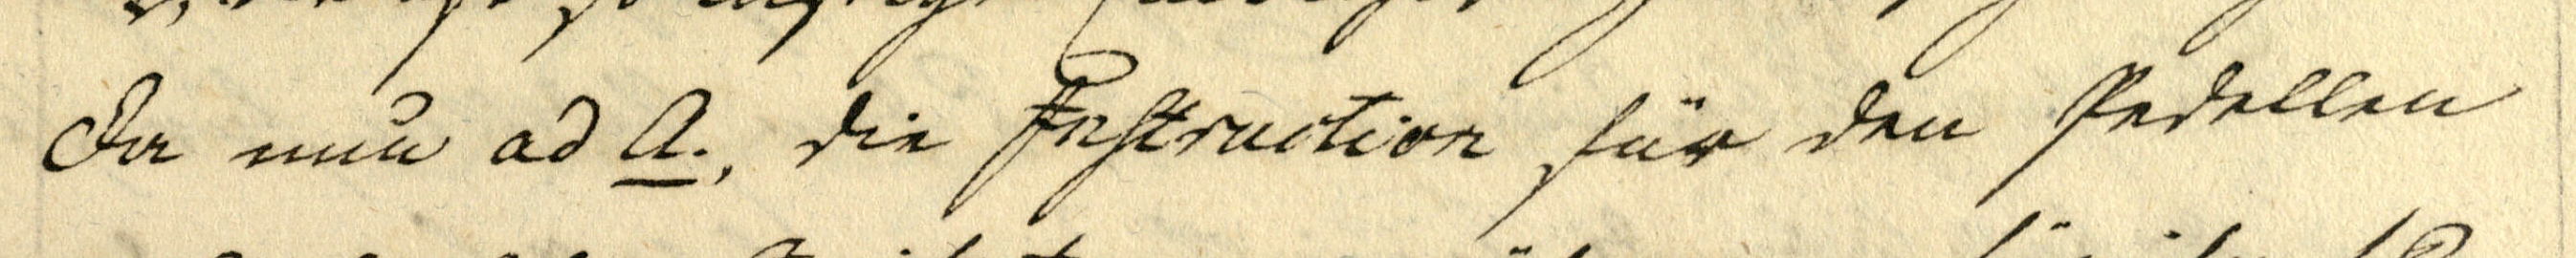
Da nun ad A., die Instruction für den Pedellen
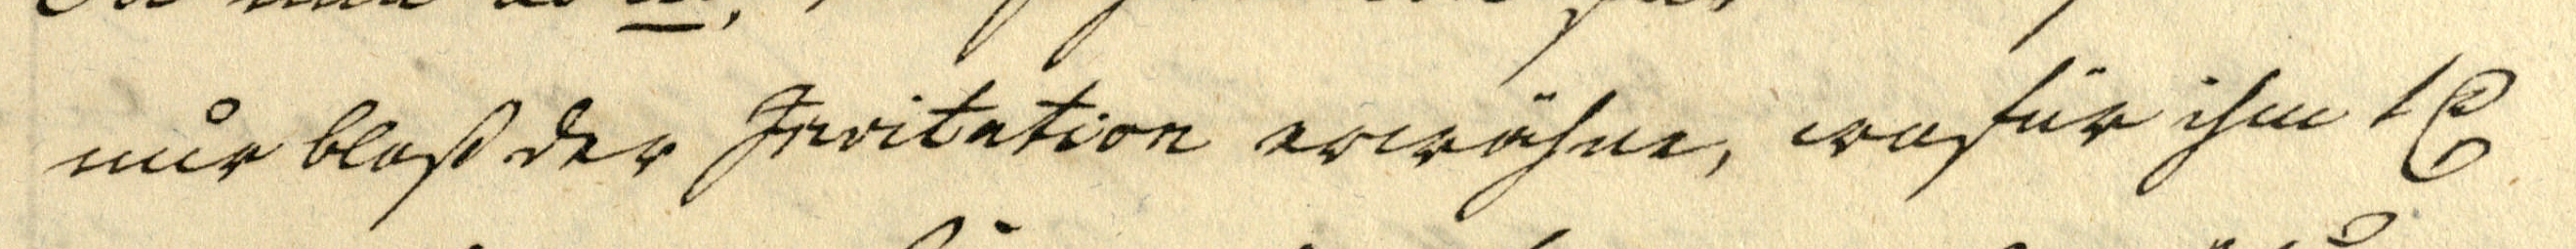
nur bloß der Invitation erwähne, wofür ihm 1l.
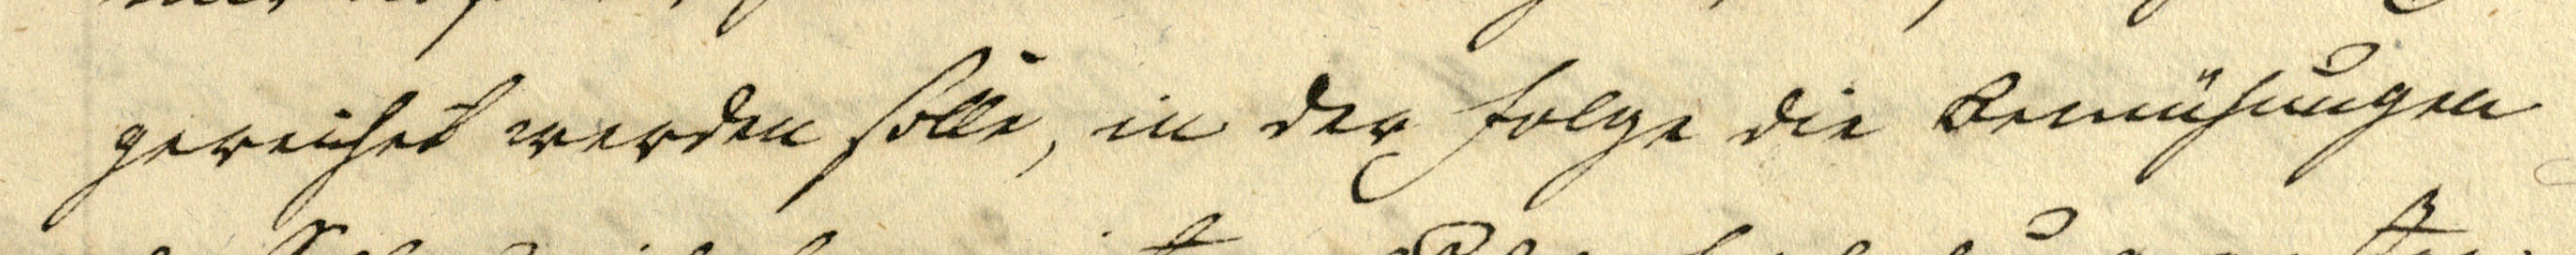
gereichet werden solle, in der Folge die Bemühungen
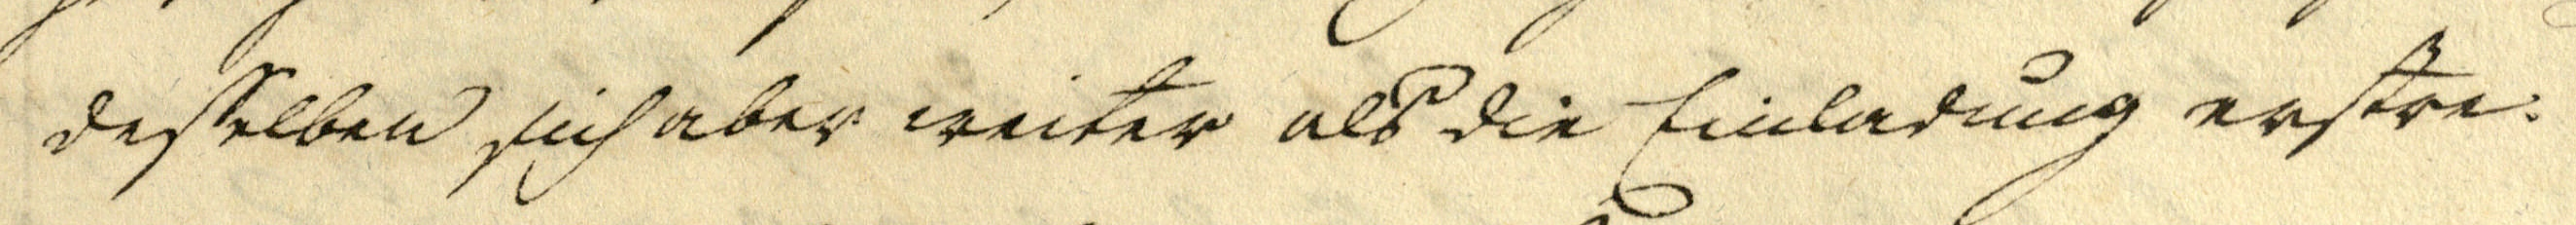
desselben sich aber weiter als die Einladung erstre¬
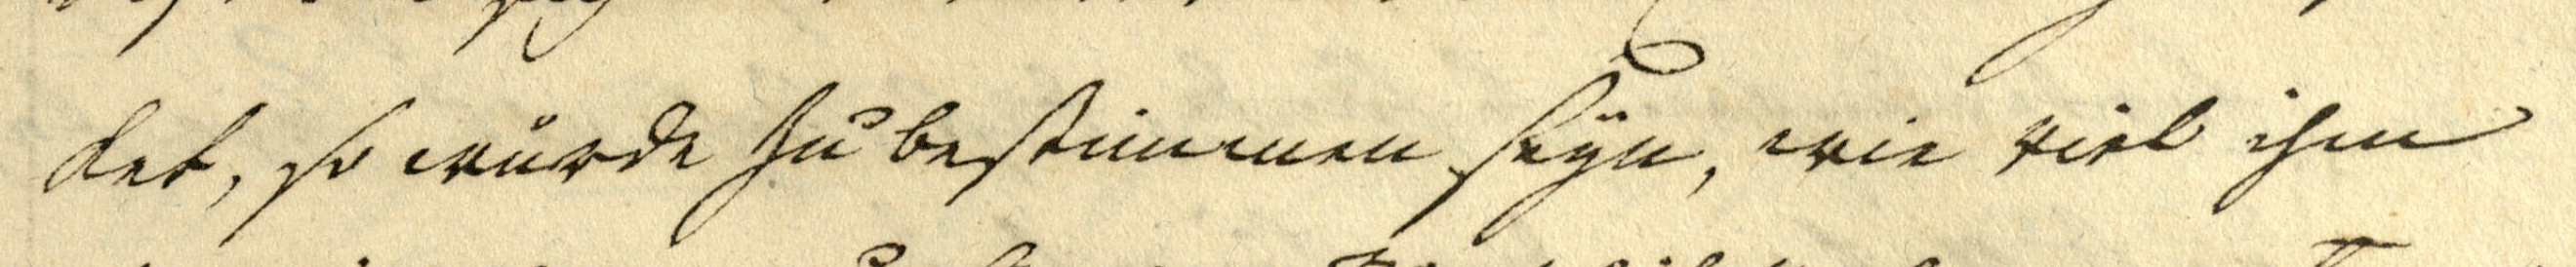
ket, so würde zu bestimmen seÿn, wie viel ihm
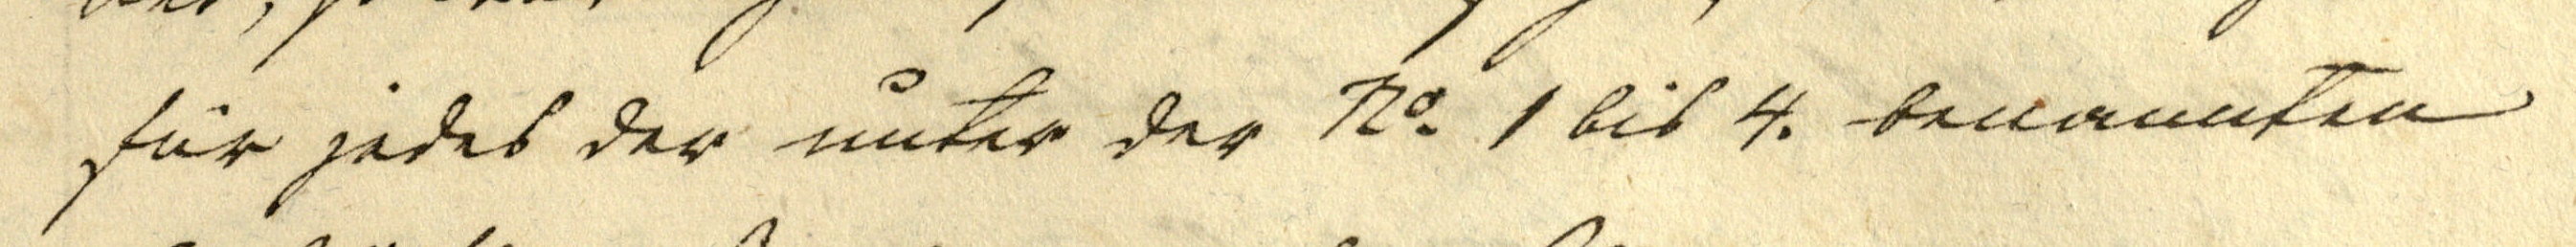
für jedes der unter der No. 1 bis 4. benannten
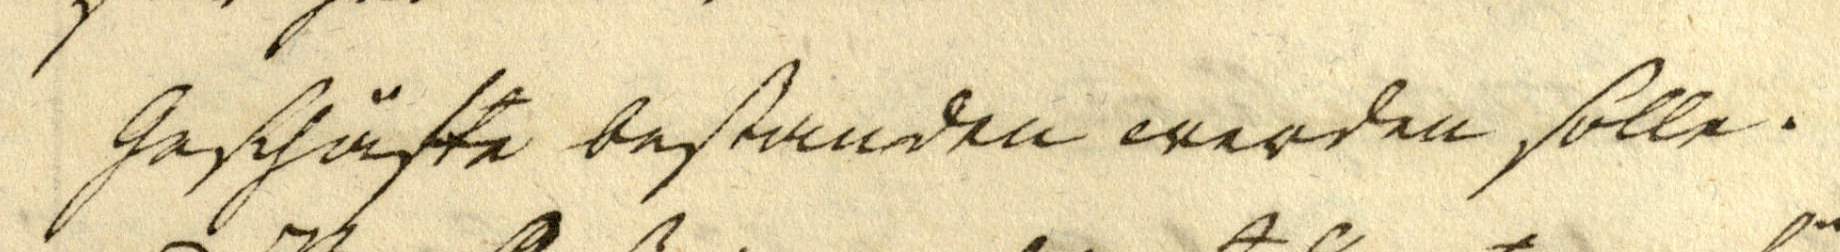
Geschäfte bestanden werden solle.
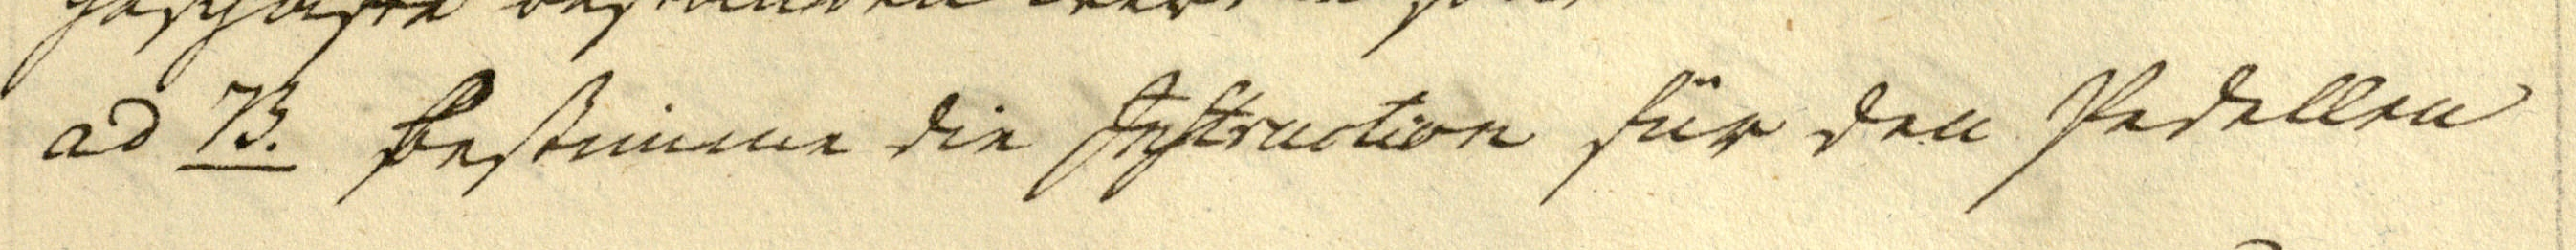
ad B. bestimme die Instruction für den Pedellen
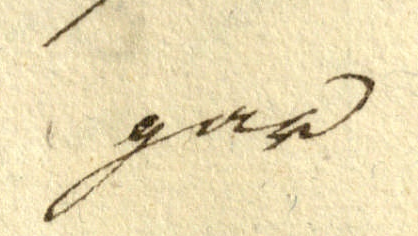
gar
